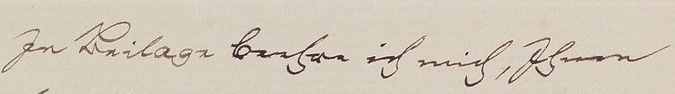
In Beilage beehre ich mich, Ihnen
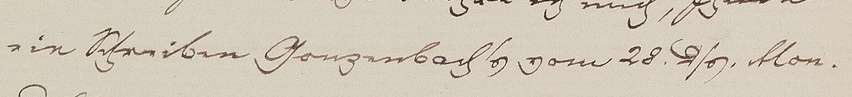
ein Schreiben Gonzenbach's vom 28. dss. Mon.
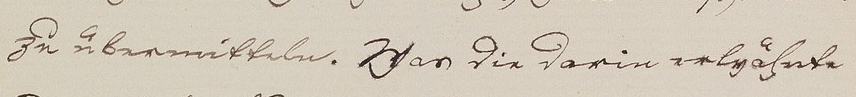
zu übermitteln. Was die darin erwähnte
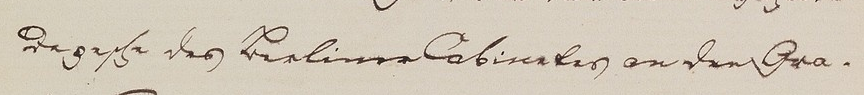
Depesche des Berliner Cabinetes an den Gra-
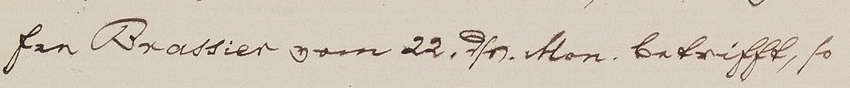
fen Brassier vom 22. dss. Mon. betrifft, so
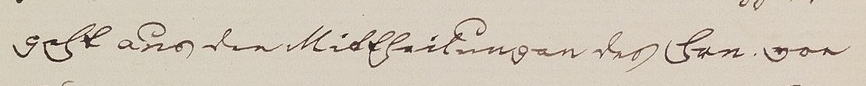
geht aus den Mittheilungen des Hrn. von
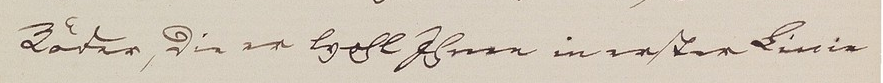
Röder, die er wohl Ihnen in erster Linie
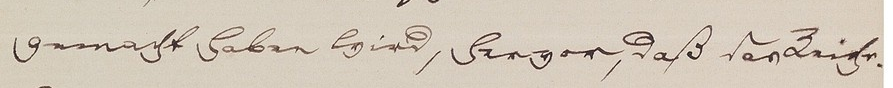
gemacht haben wird, hervor, daß das Reichs-
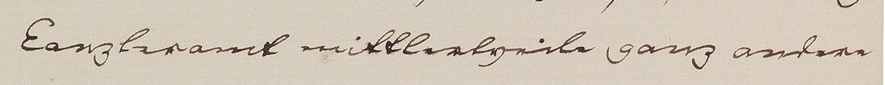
kanzleramt mittlerweile ganz andere
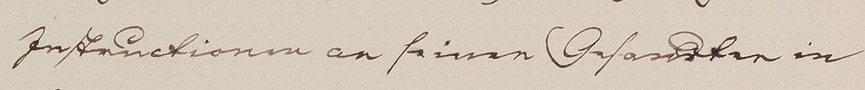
Instructionen an seinen Gesandten in
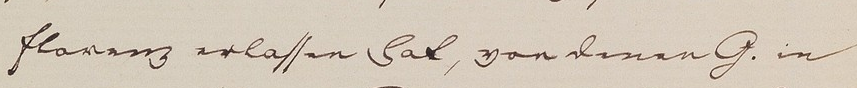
Florenz erlassen hat, von denen G. in
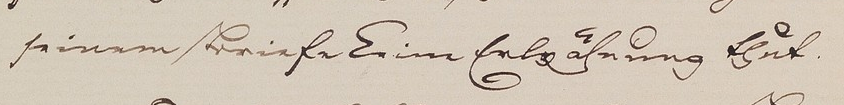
seinem Briefe keine Erwähnung thut.
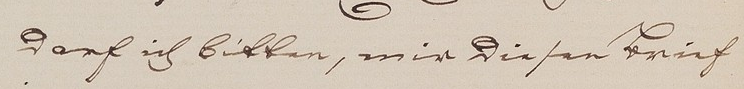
Darf ich bitten, mir diesen Brief
